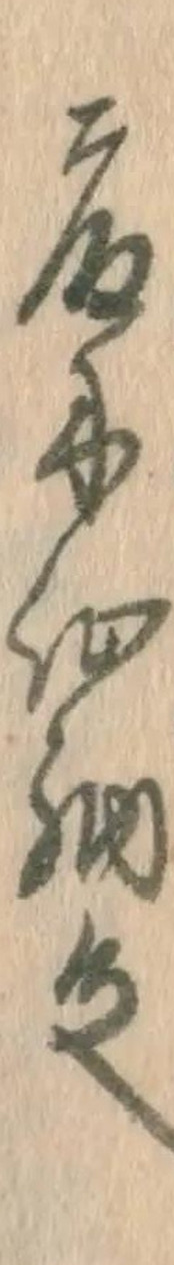藤木仙納殿
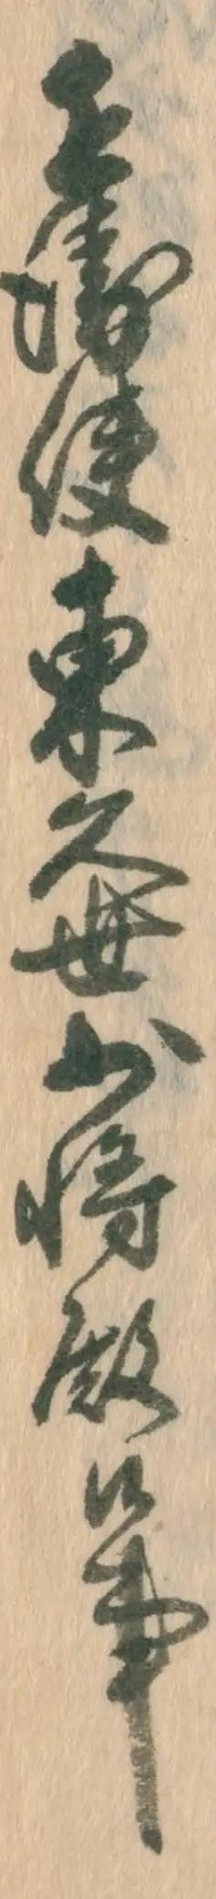近衛使東久世少将殿候事

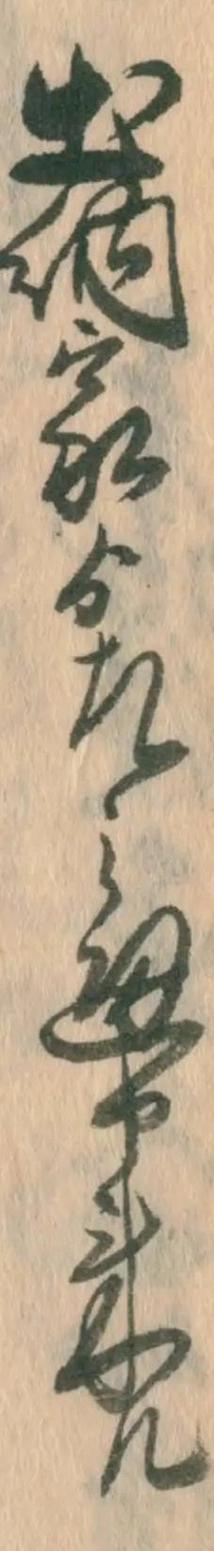出納家ゟ左之通申来ル
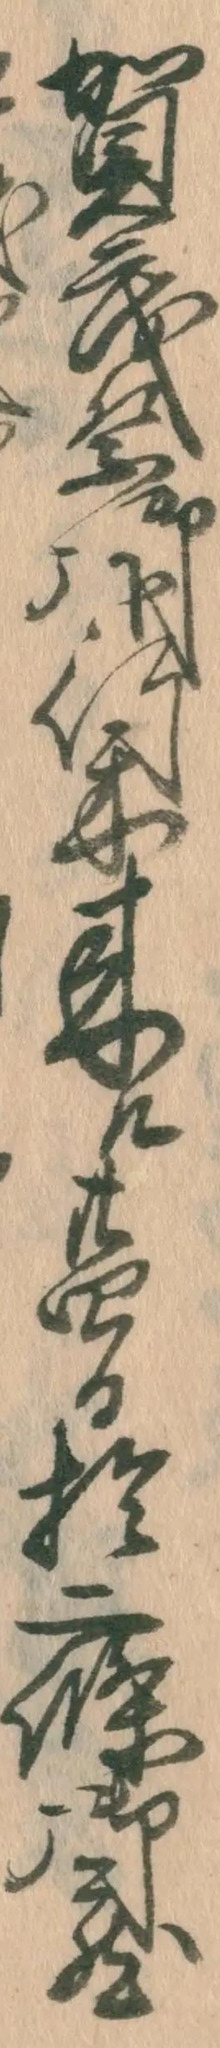賀茂祭御下行米来ル廿四日於二條御蔵
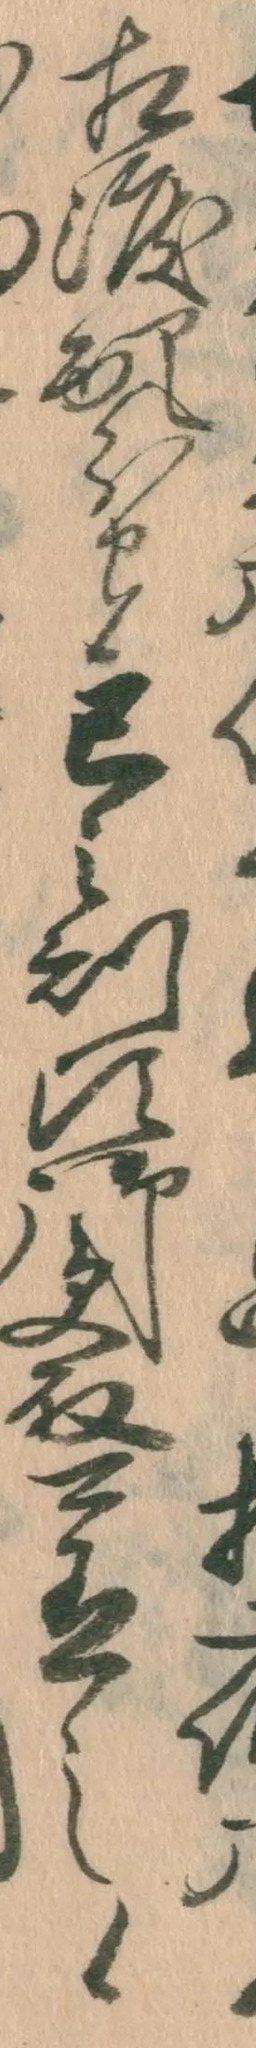相渡配分申候巳之刻頃御受取可有之候
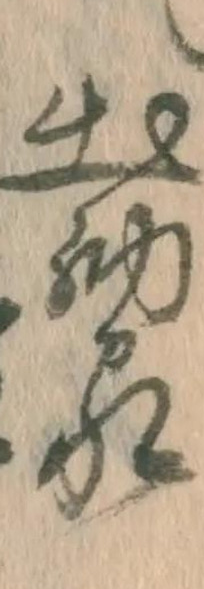出納家
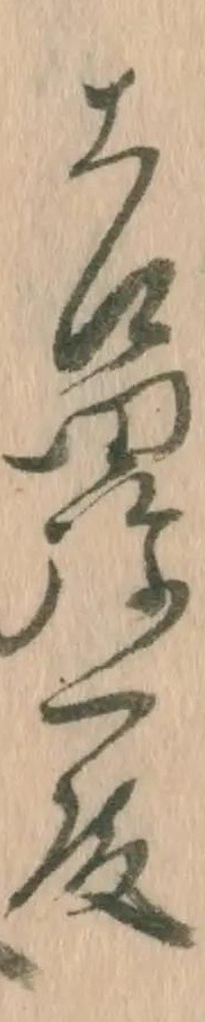吉田弥一殿
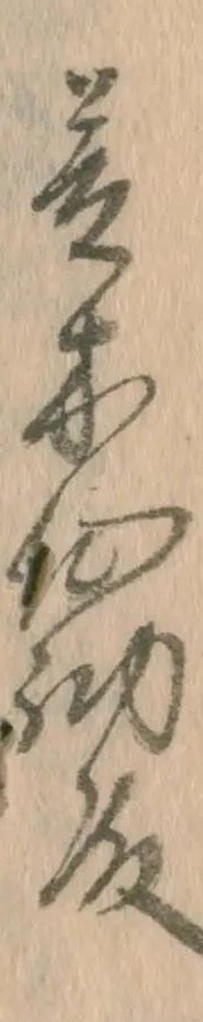藤木仙納殿
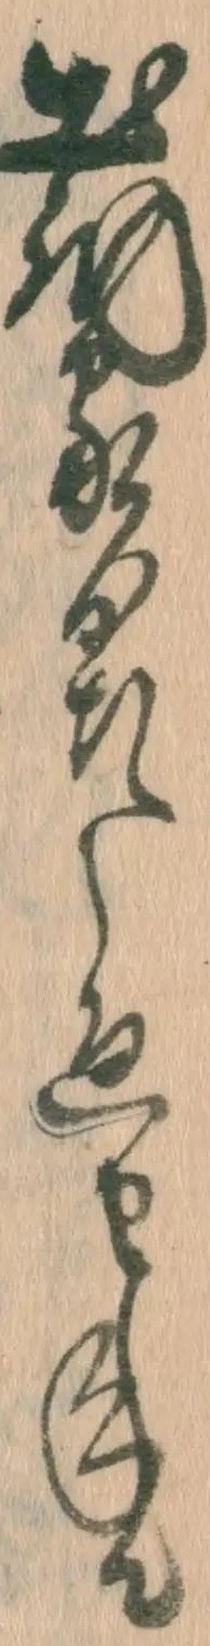出納家ゟ左之通申来ル
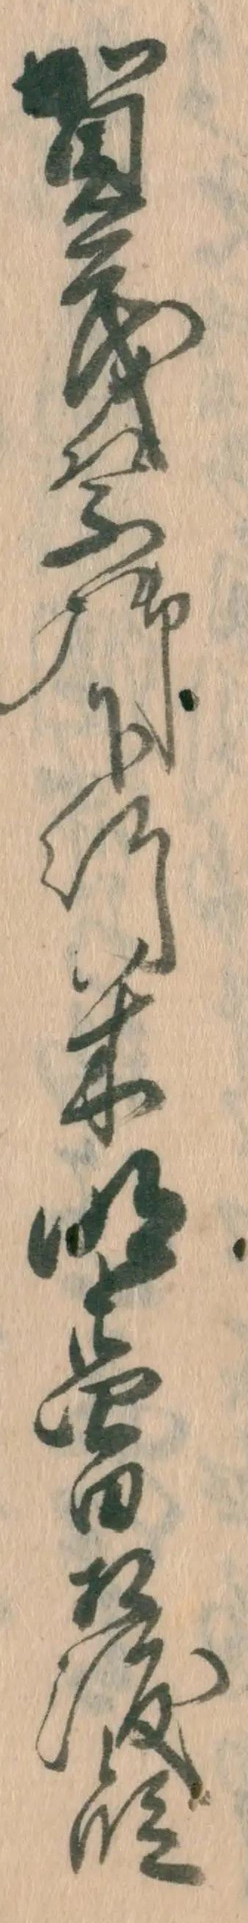賀茂祭御下行米明廿四日相渡候段
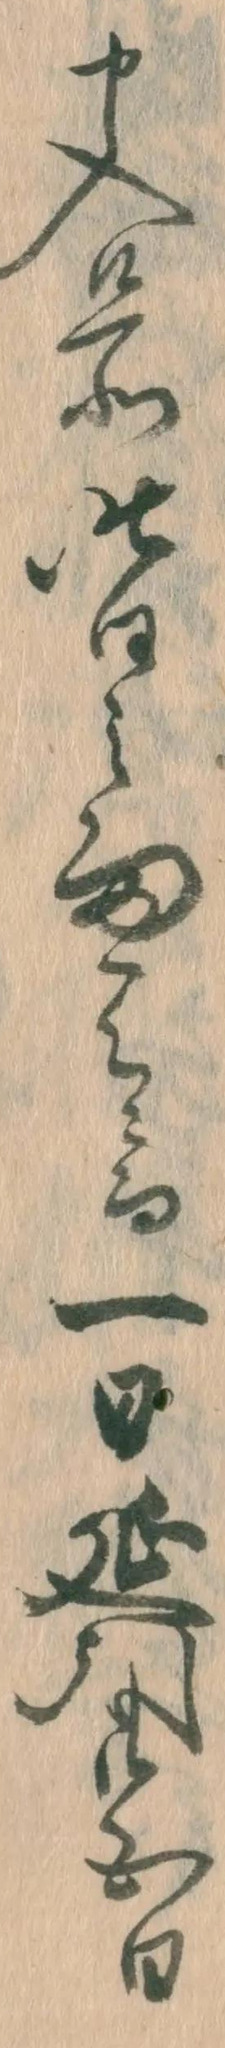申入候所昨日之雨天ニ而一日延引廿五日
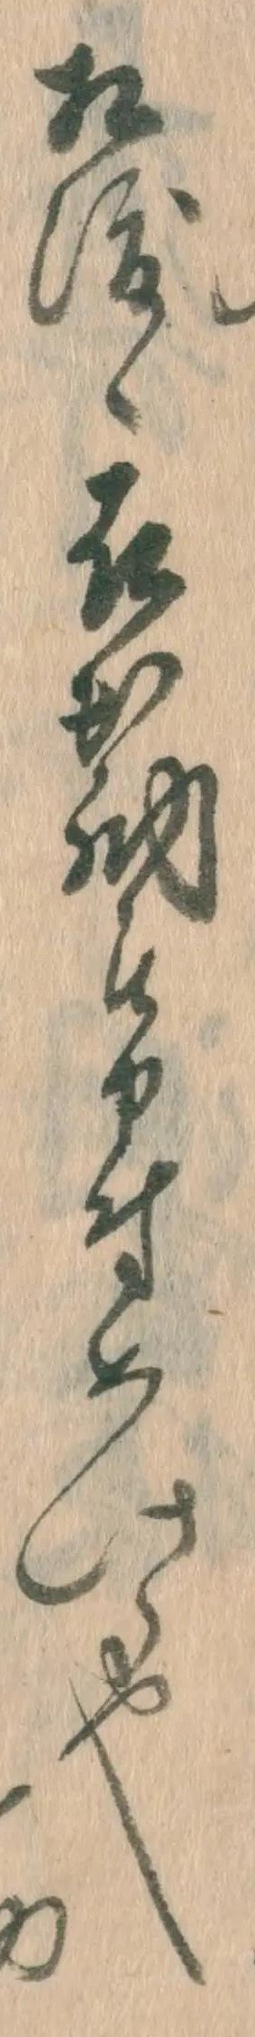相渡候右出納被申付如此候也
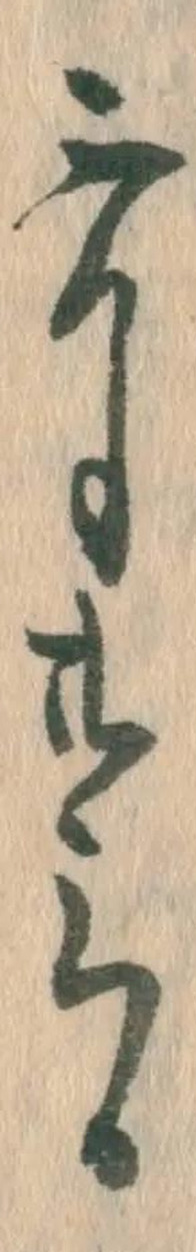二月廿三日

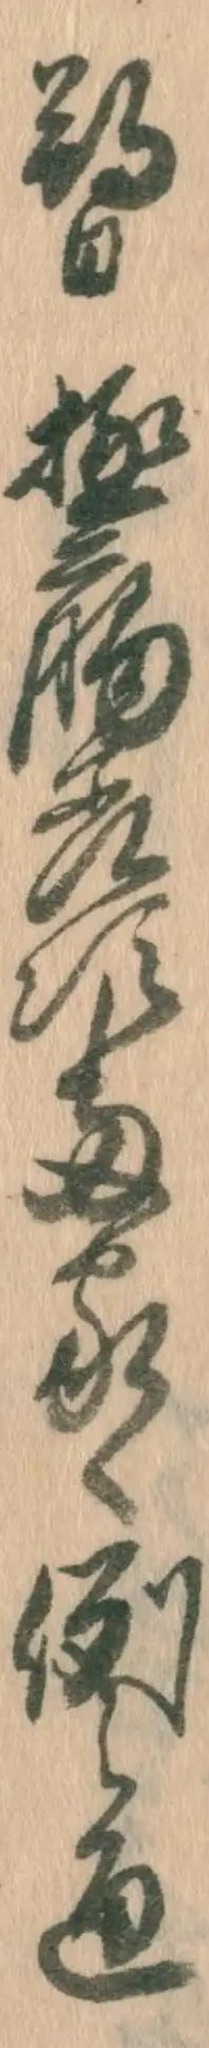朔日極臈差次両家へ例之通
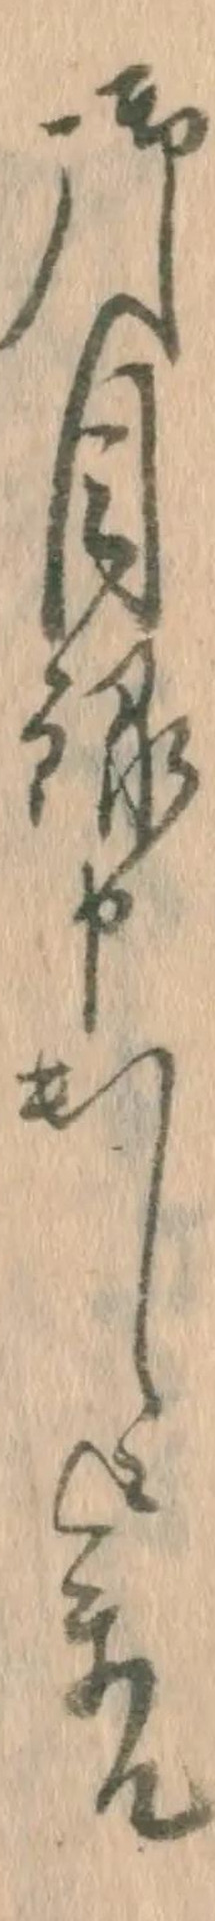御目録申出しニ参ル
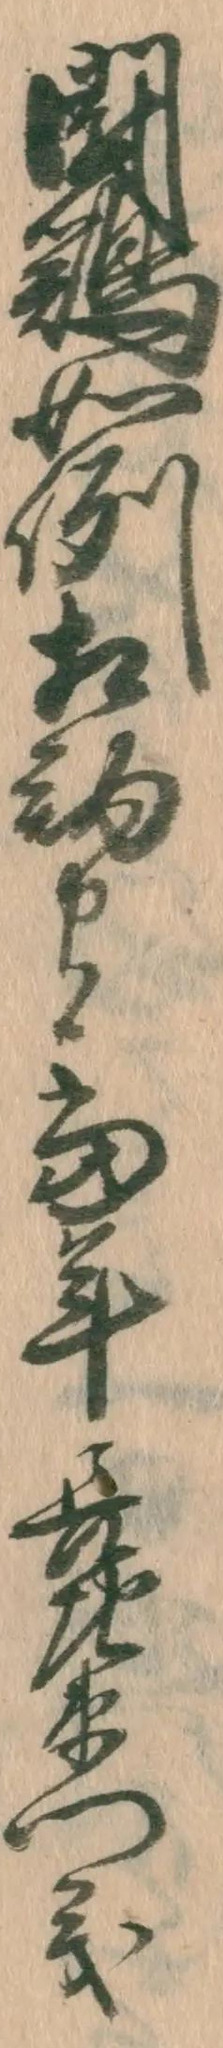闘鶏如例相勤申候当年喜左衛門義
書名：賀茂社記録. 第61冊
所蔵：国立国会図書館 National Diet Library, JAPAN
